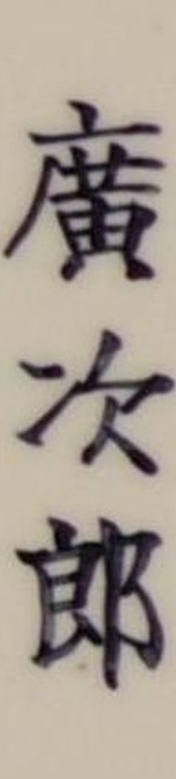近次郎

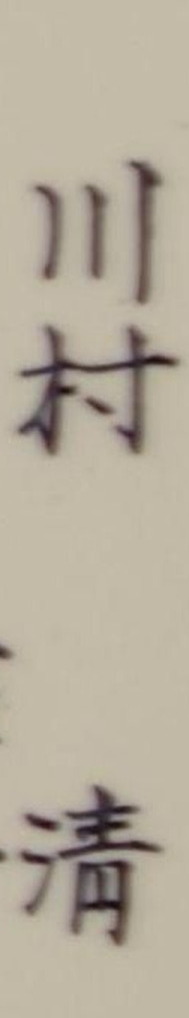川村清
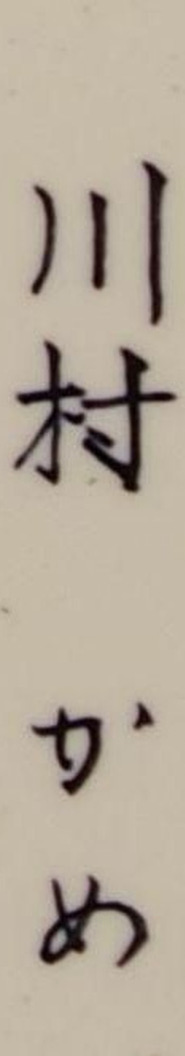川村かめ
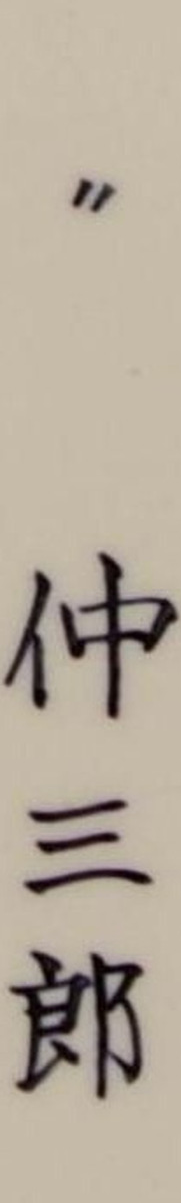仲三郎
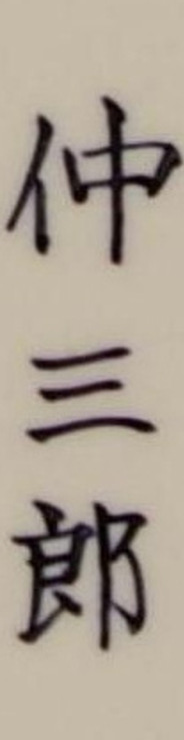仲三郎
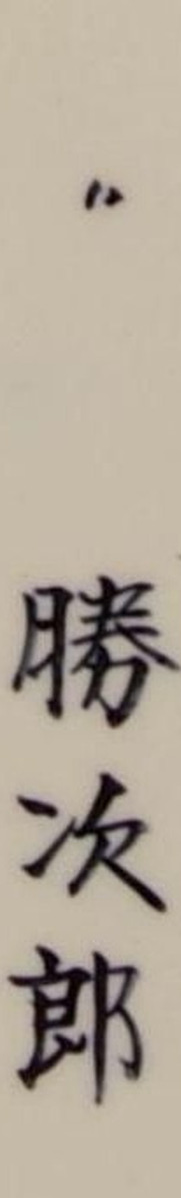勝次郎
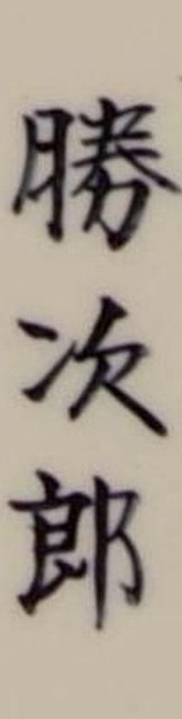勝次郎
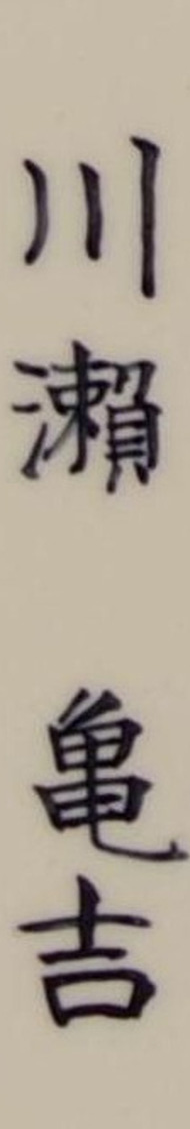川瀬亀吉
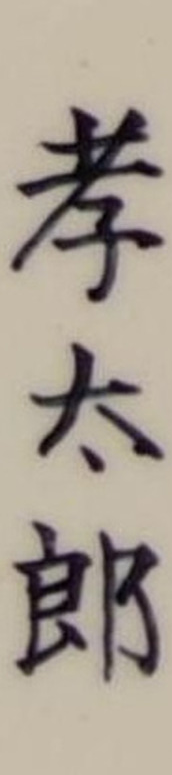孝太郎
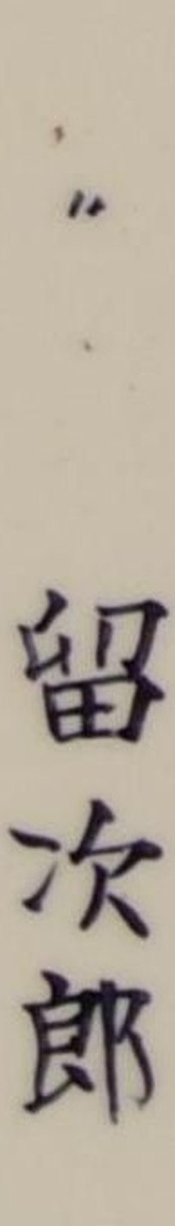留次郎
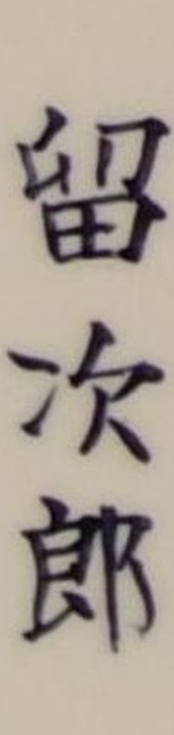留次郎

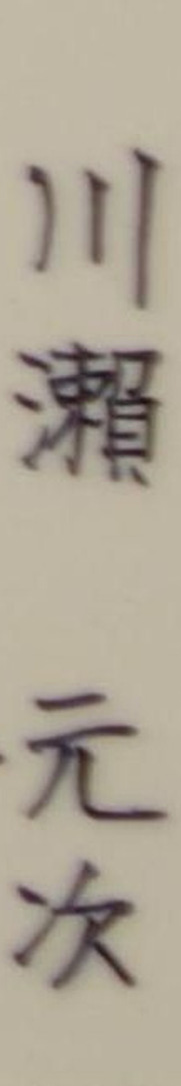川瀬元次
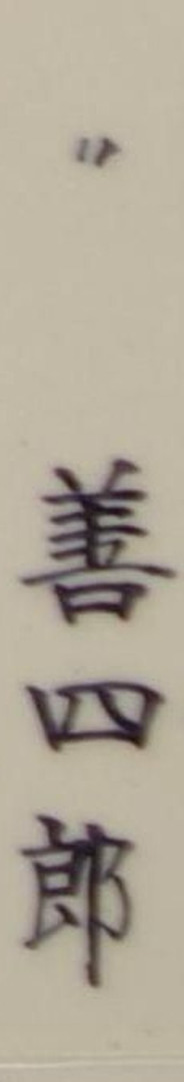善四郎
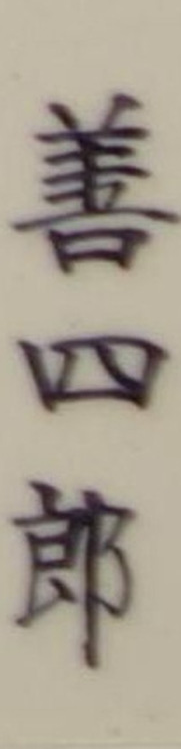善四郎
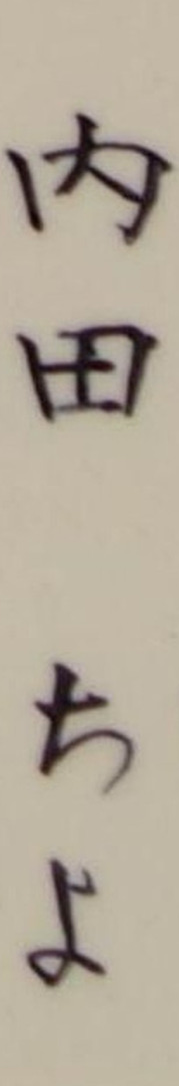内田ちよ
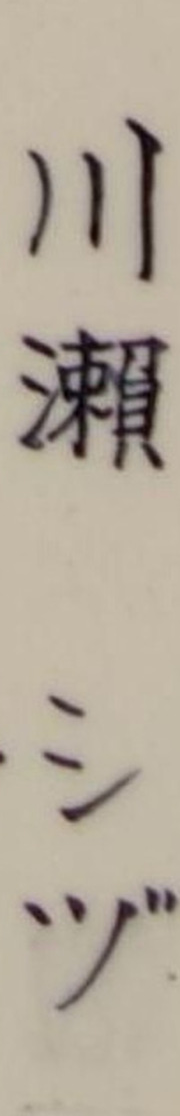川瀬シヅ
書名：M~S
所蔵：高野山金剛峯寺
